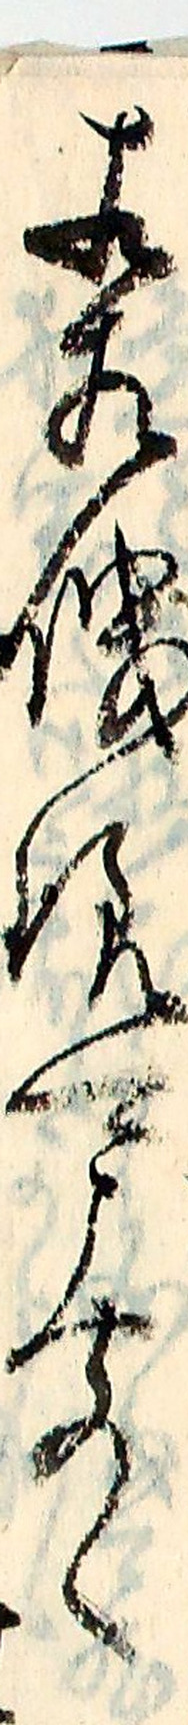相相洩様可申聞候
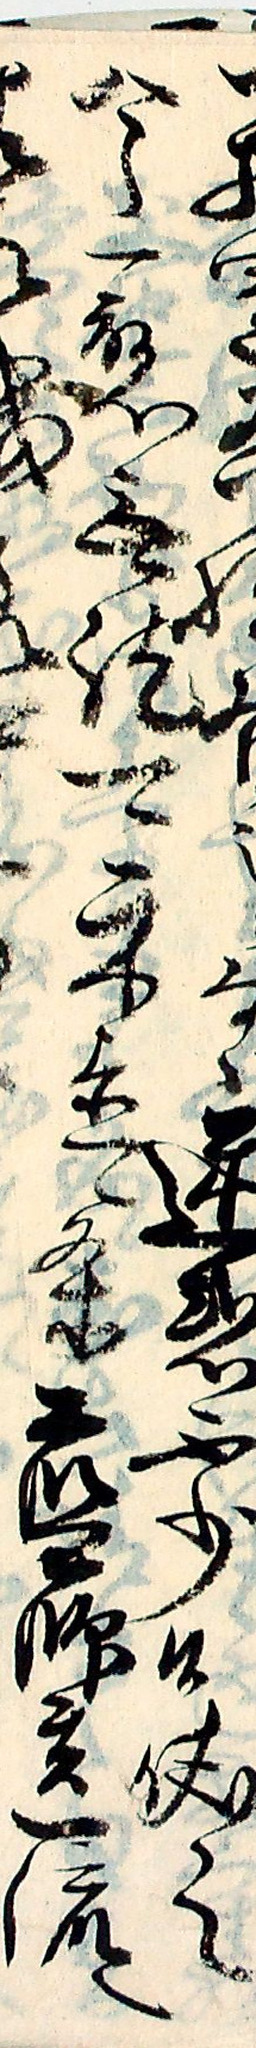今一応無訖可示置候条藍師共一流へ
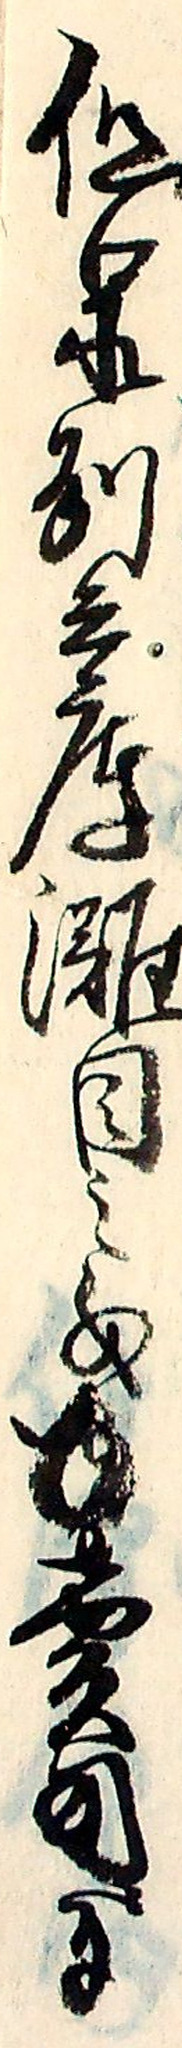但泉州兵庫灘目之義は売用に付

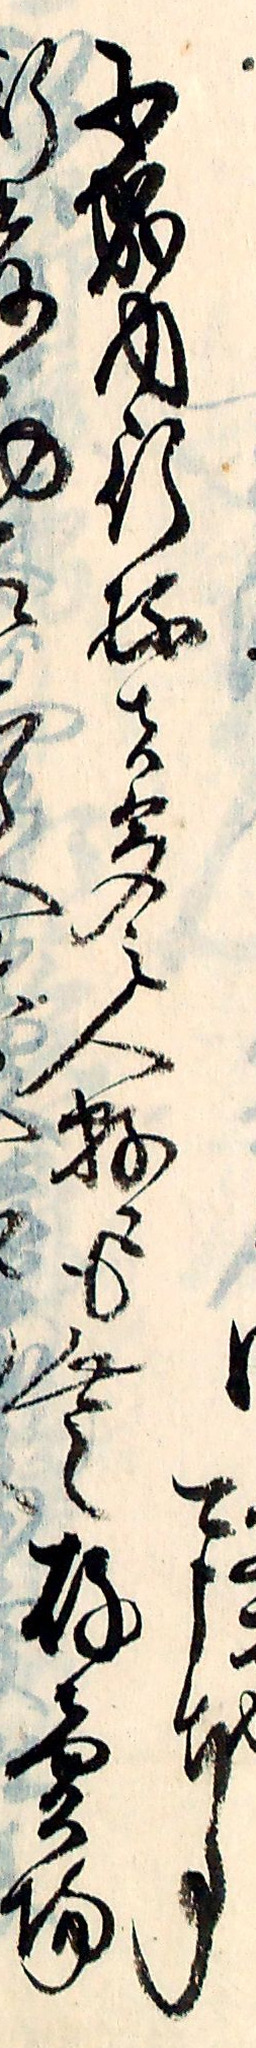五畿内行抔は多之人数にも無之故売場
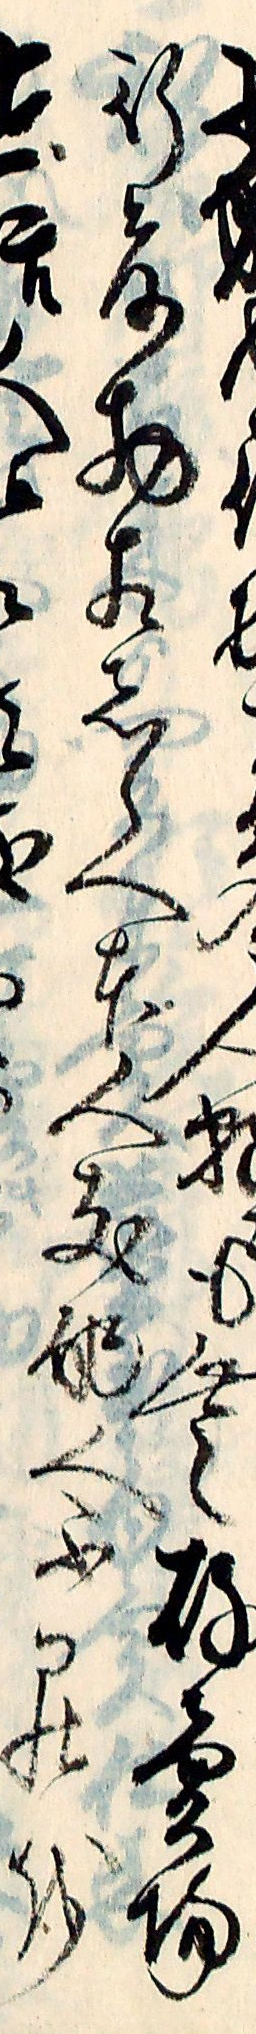行荷物相しらへ本人支配人不罷越
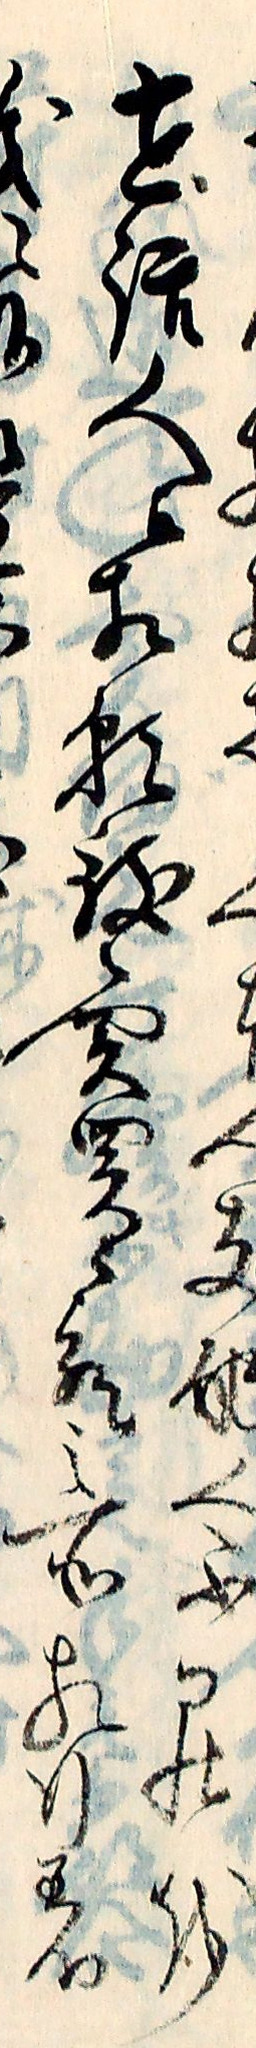世話人え相頼致売買候歟之所相行着
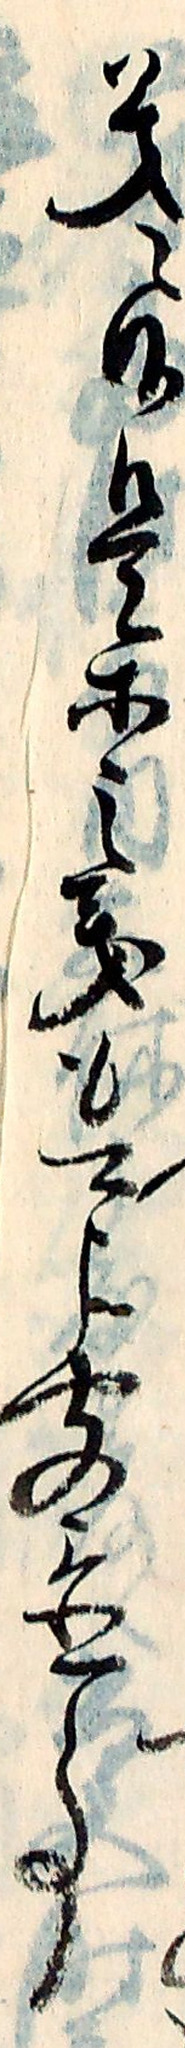義に候是等之義も可申聞置事
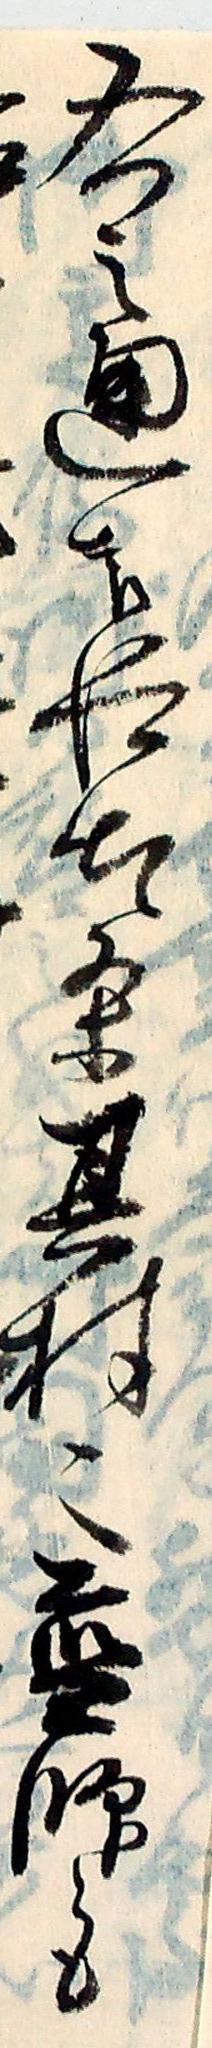右之通被仰出候条其村々藍師とも
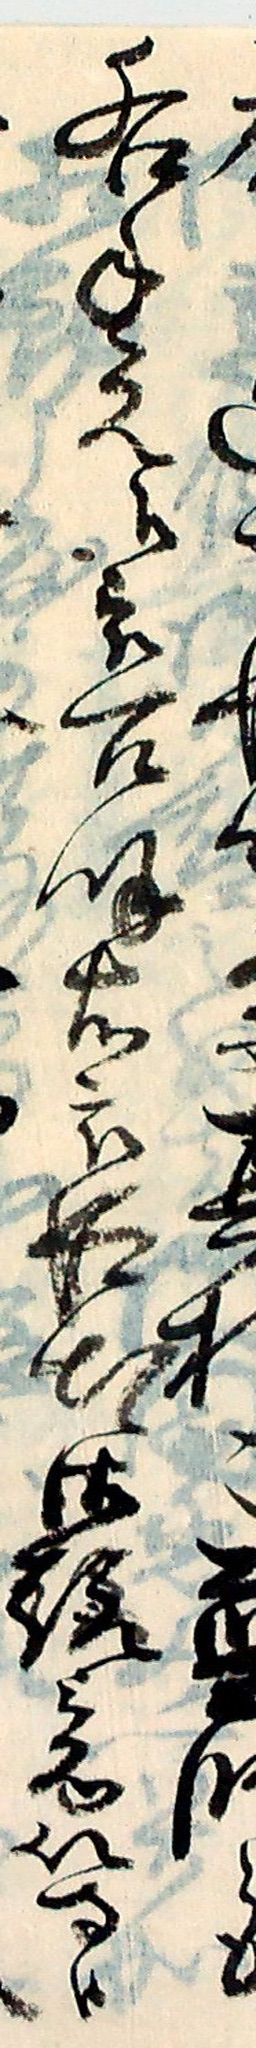各手元え被召呼右被仰出候御趣意等被
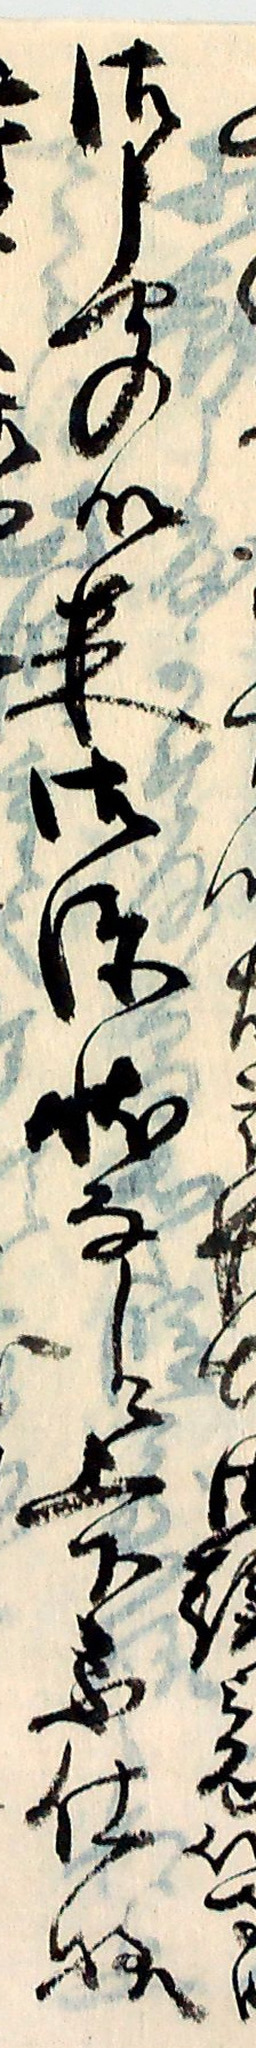御申聞以来御添状なしに上下不仕様
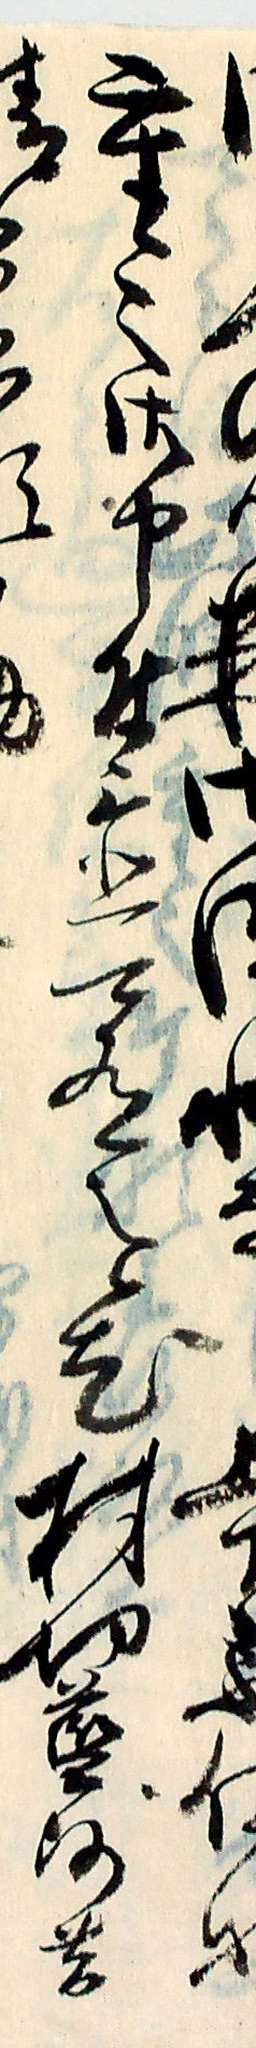重々御申付置可有之候尤村切藍師共
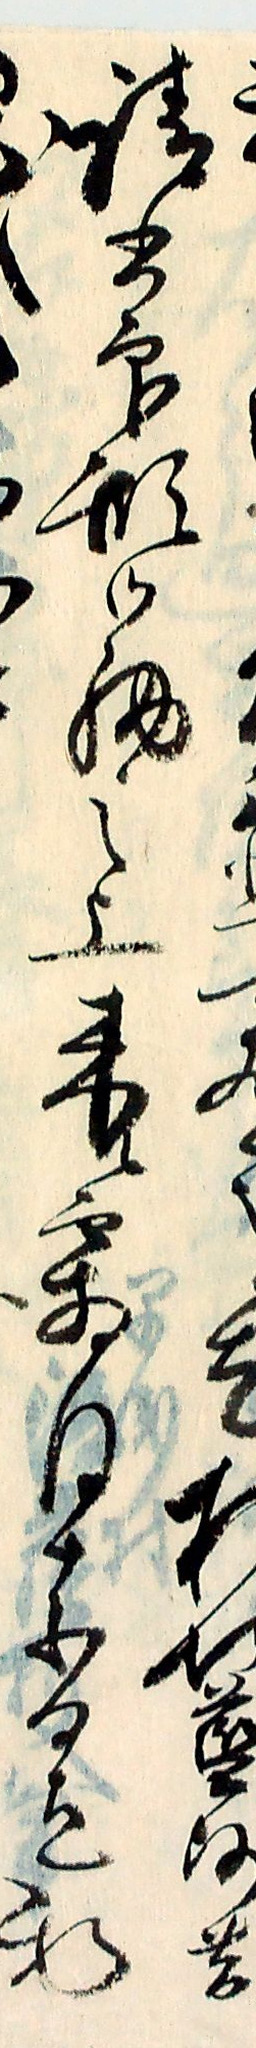請書印形御認之上来る霜月十五日迄私
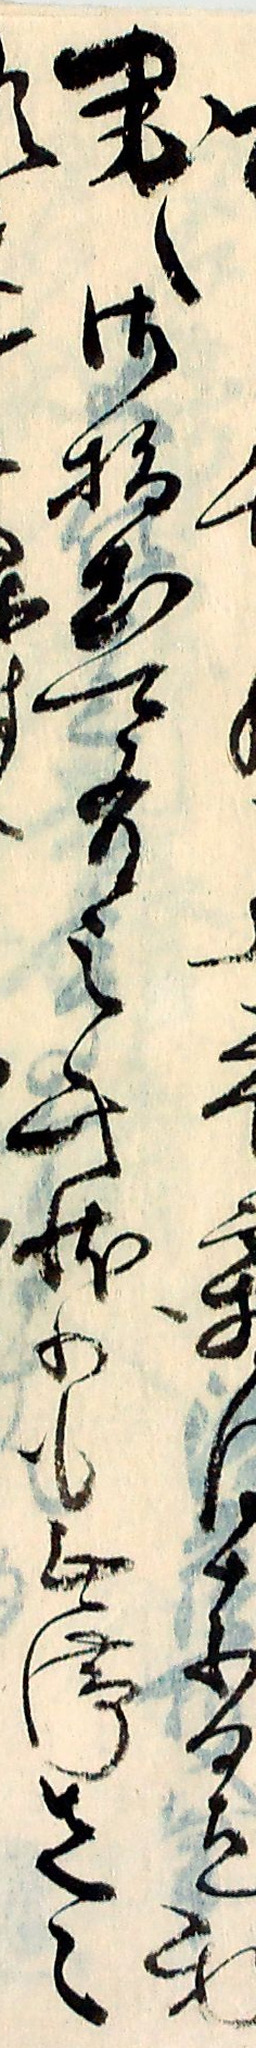宅へ御指出可有之此状少も無滞先々
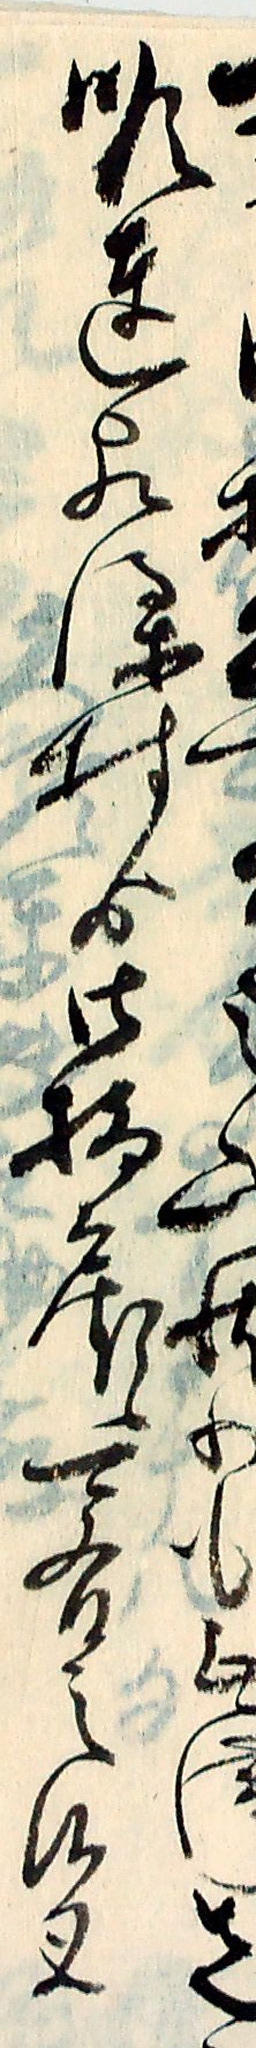順達相済村ゟ御指戻し可有之候以上
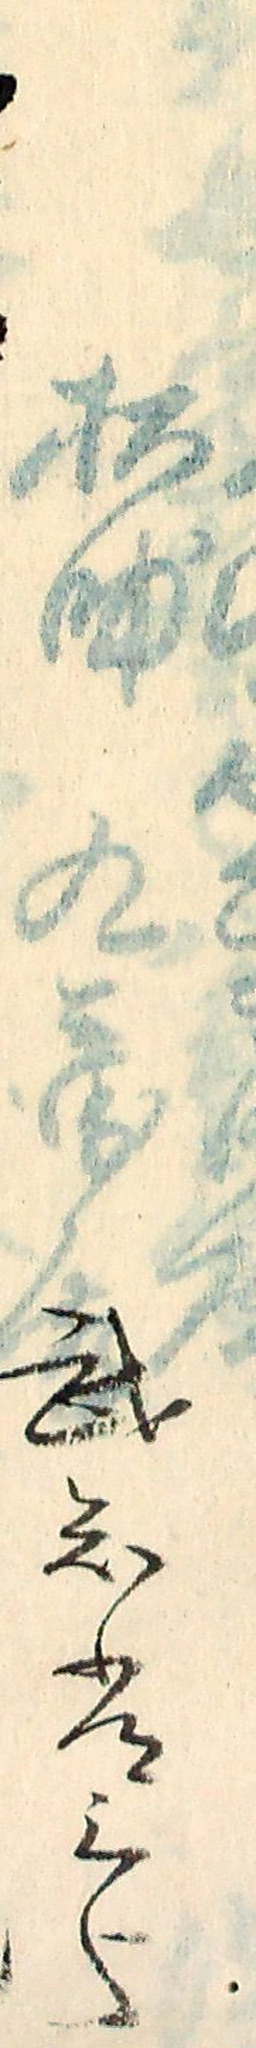武知常三郎
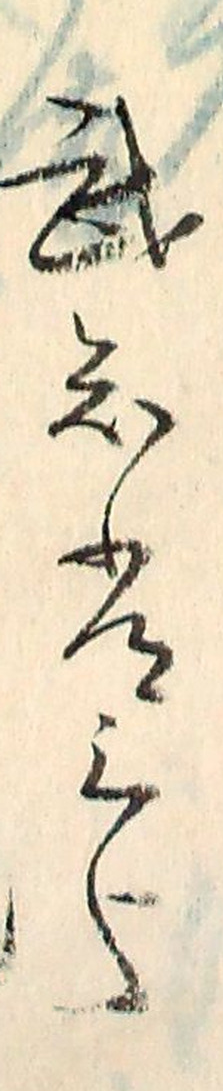武知常三郎
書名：諸御願書控(後藤氏壱番）
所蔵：鳴門教育大学 Naruto University of Education
